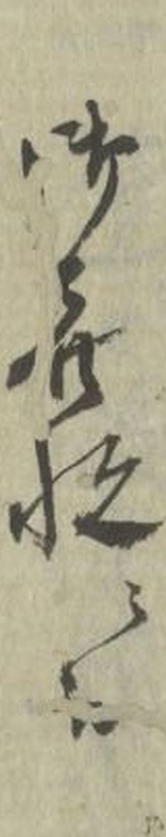御喜悦に被
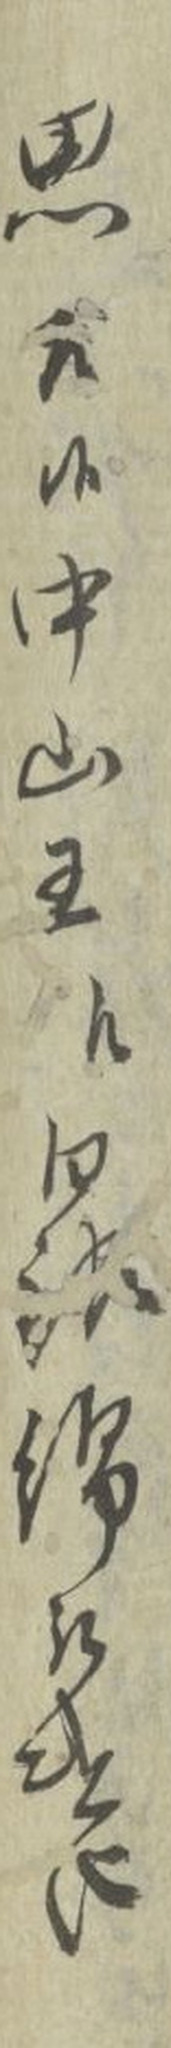思召候中山王え白銀綿被遣候
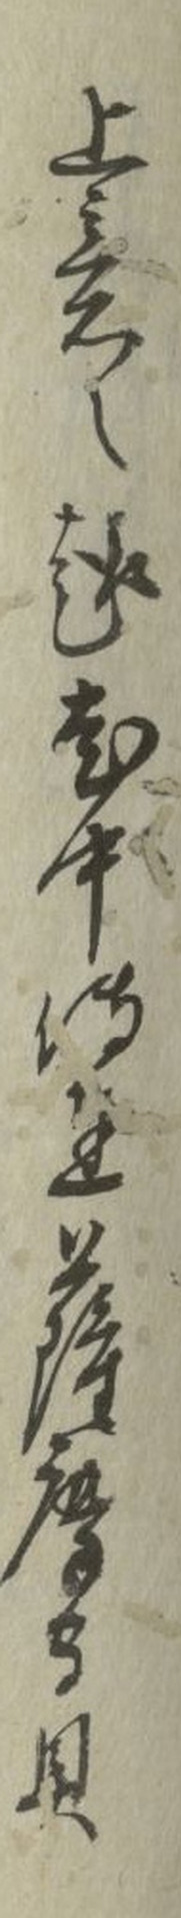上意右之趣老中伝達薩摩守具
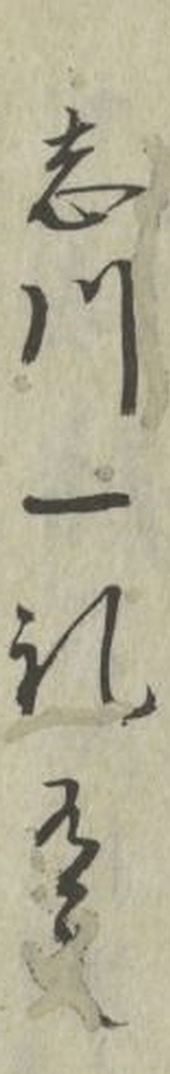志川一礼有之
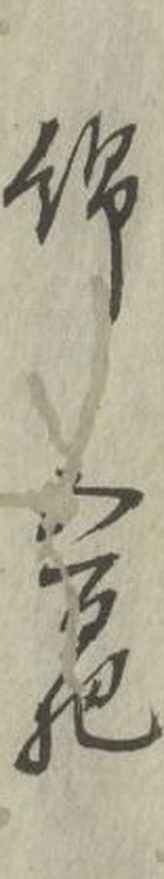綿五百把
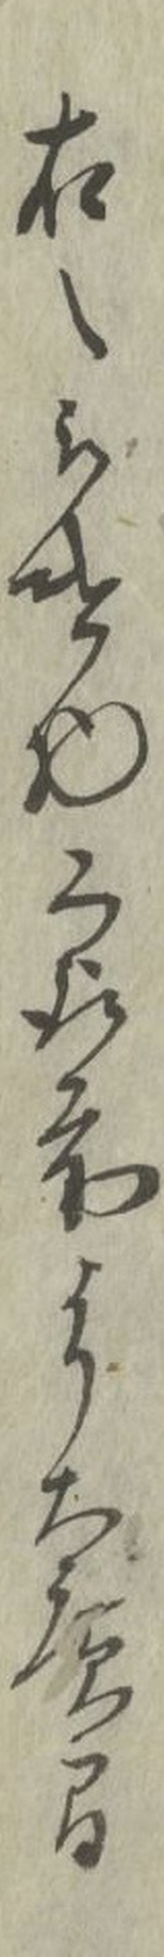右之被遣物最前より大広間

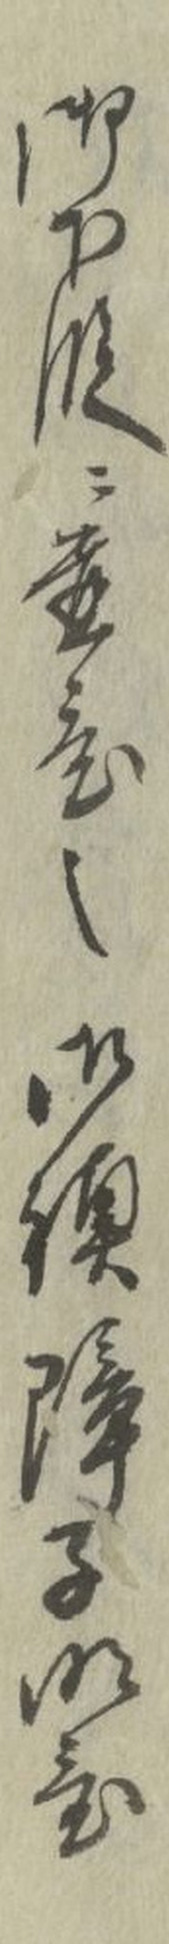御下段に並置之御襖障子明置
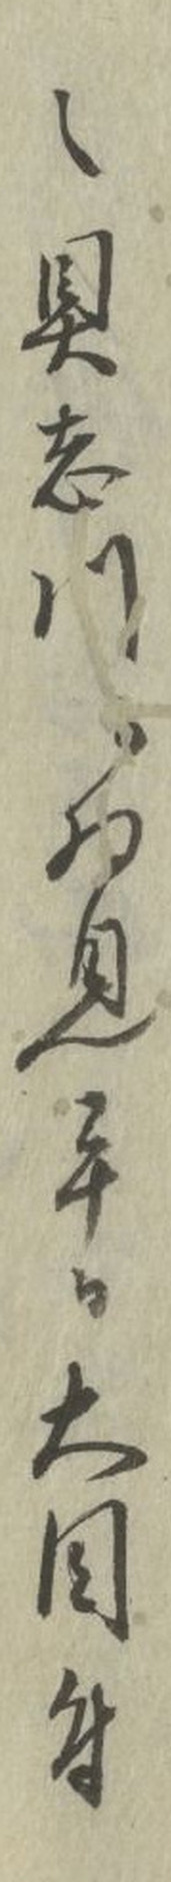之具志川え為見畢而大目付
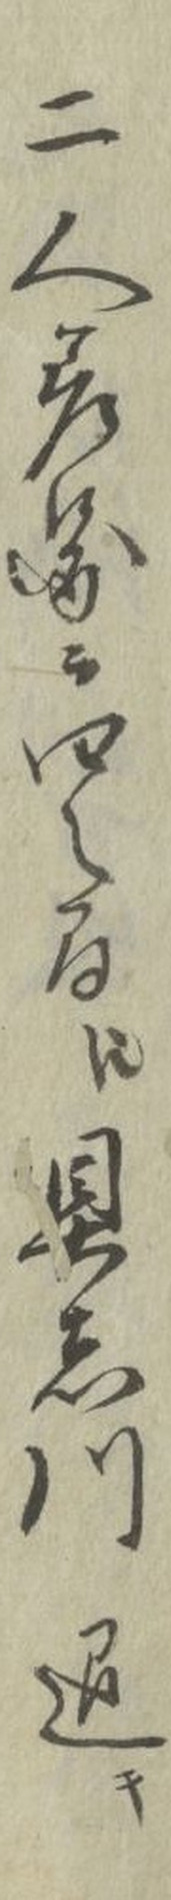二人差図而四之間え具志川退き
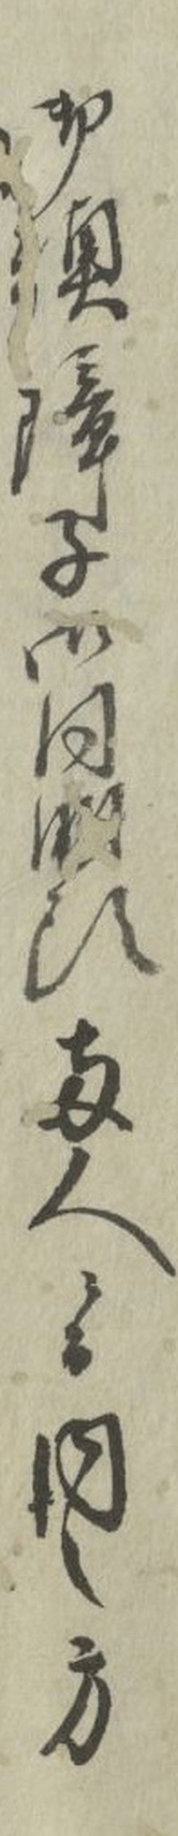御襖障子御同朋頭両人に而内之方
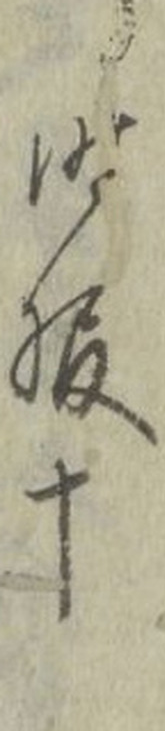時服十
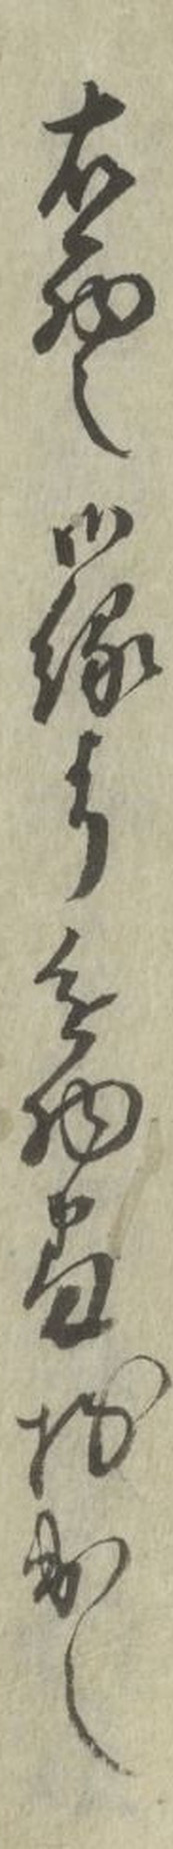右西之御縁より進物番持出之
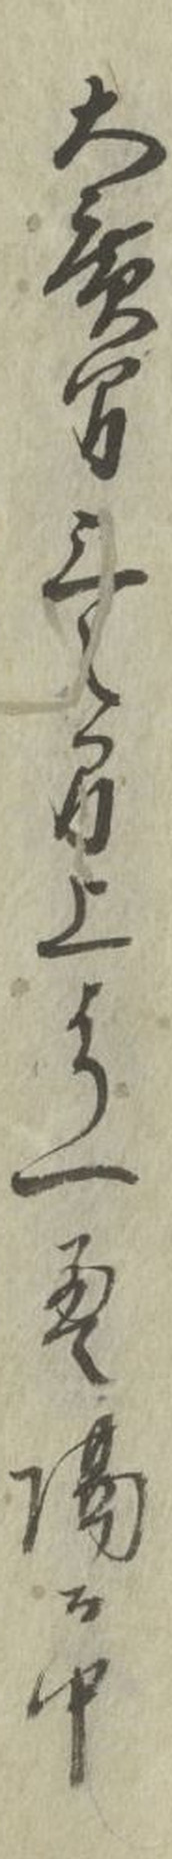大広間三之間上より一畳隔而中
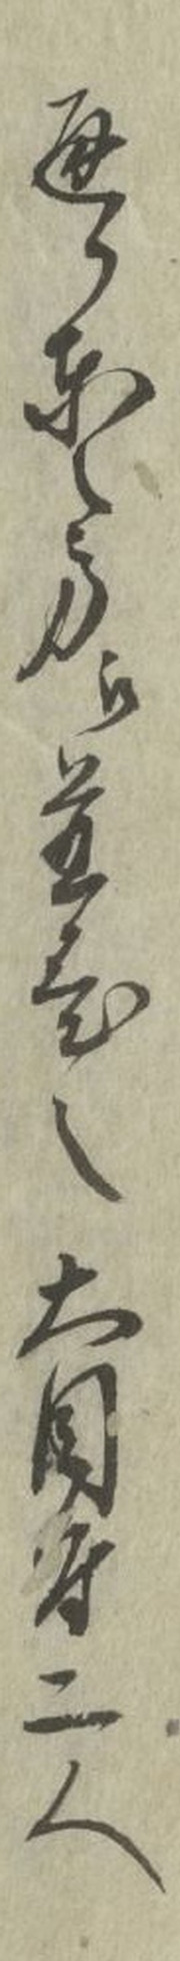通り東之方え並置之大目付二人

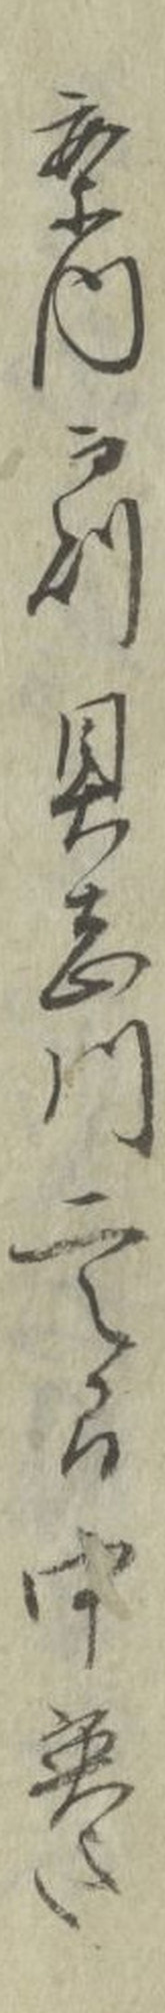案内而則具志川二之間中英迄
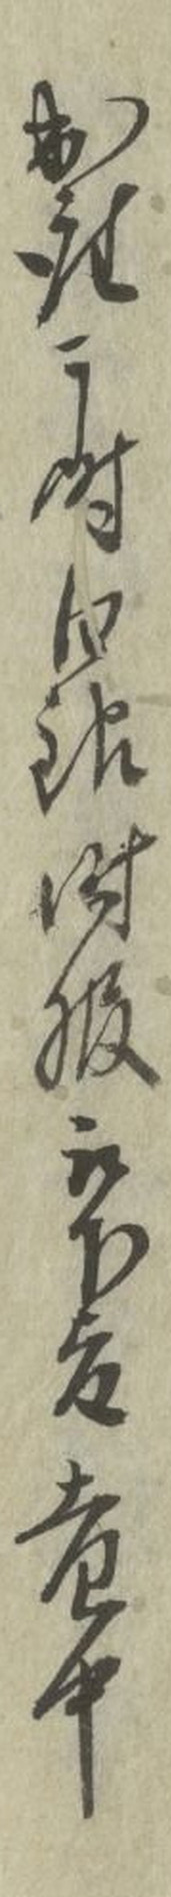出座于時白銀時服被下旨老中
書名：琉球来朝記 自八至十四終
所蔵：University of the Ryukyus Library
